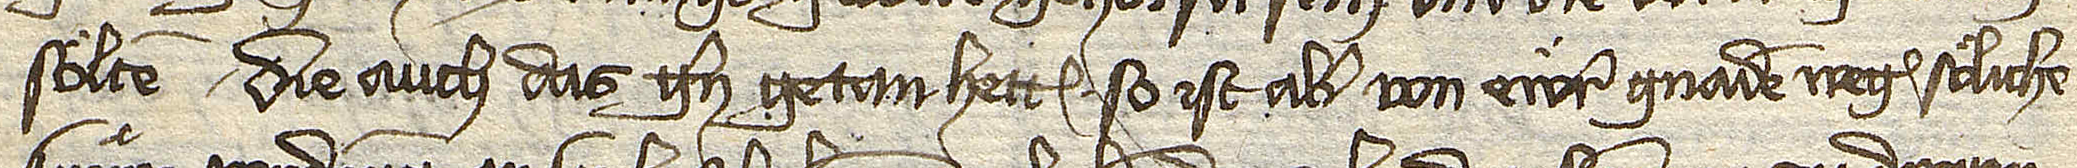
ſölte* / Die auch das g*n getan hett* . ſo iſt ab* von eẅr* gnade* weg* ſöliche
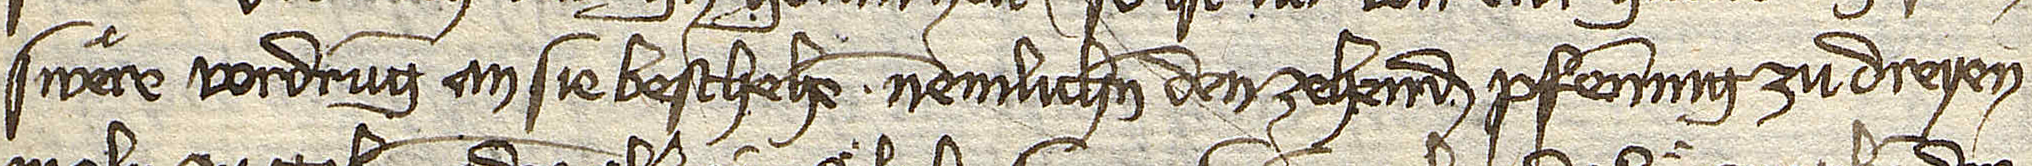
ſwëre vordru*g an ſie beſchehe* . nemlichn* den ʒehend* pfen*nig ʒu dreyen
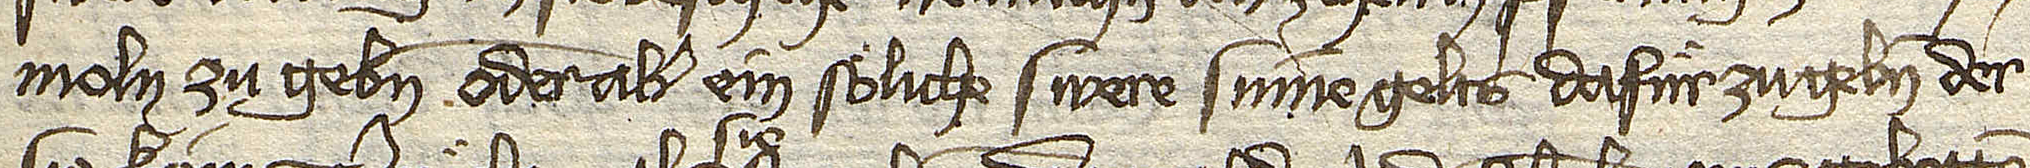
moln ʒu gebn* oder ab* ein ſöliche ſwere ſum*e gelts dafür ʒu gebn* der
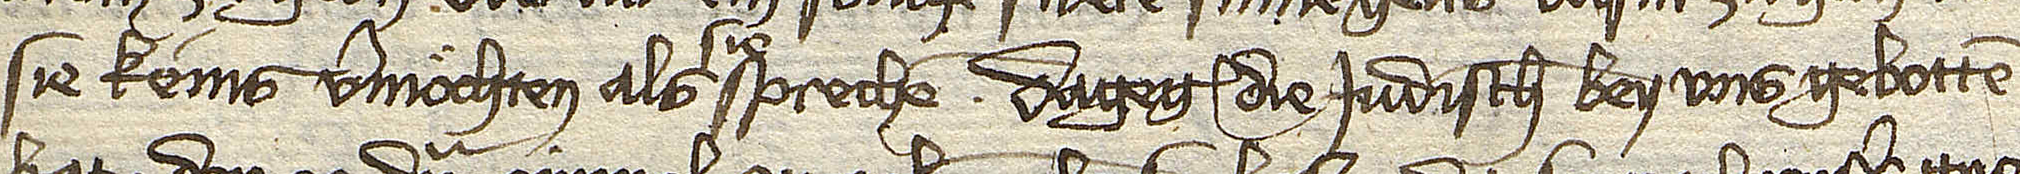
ſie keins v*möchten als ſpreche* . Dageg* die Iudiſch* bey vns gebotte*
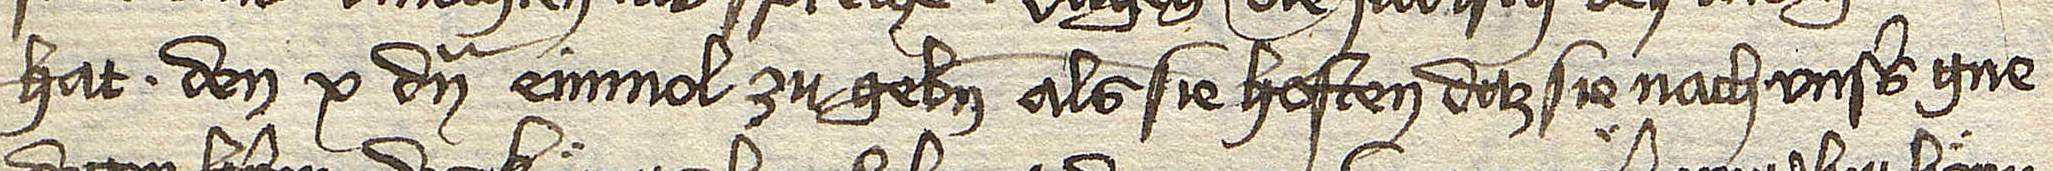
hat . den x dn* einmol ʒu gebn* als ſie hoften daʒ ſie nach vnſ*s gne
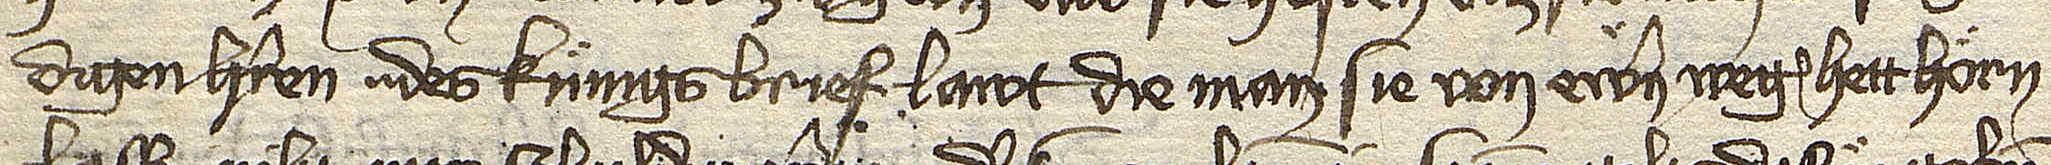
digen h*ren ~ des künigs brief lawt die man ſie von eẅ*n weg* hett hörn
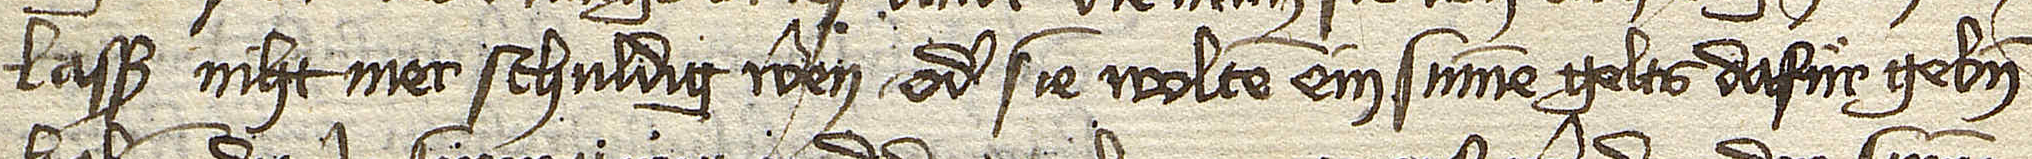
laſſ* niht mer ſchuldig w*en / od* ſie wolte* ein ſum*e gelts dafür gebn*
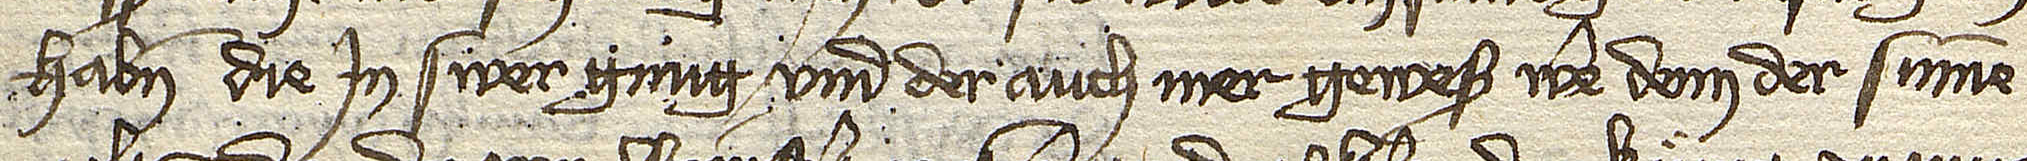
habn* die In ſwer ging vnd der auch mer geweſ* w*e denn der ſum*e
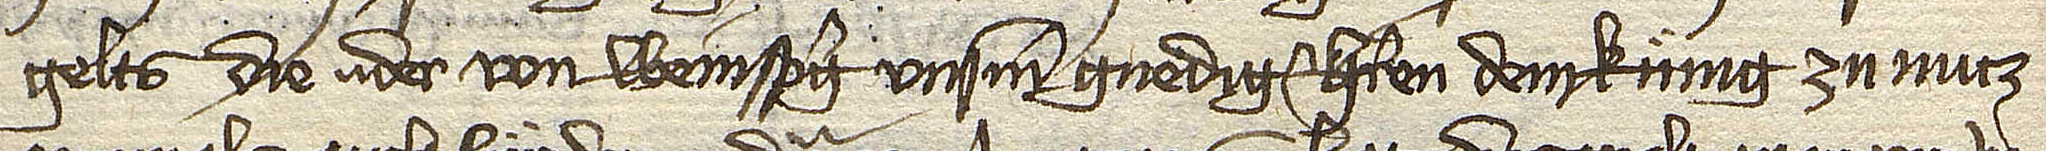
gelts die ~ der von Weinſp*g vnſm* gnedig* h*ren dein künig ʒu nucʒ
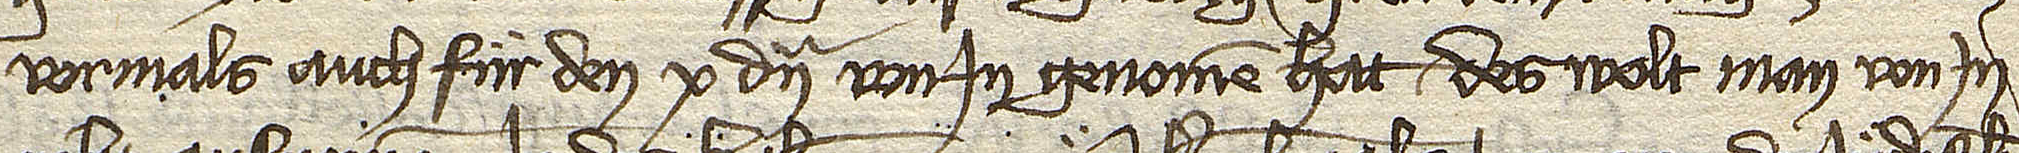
vormals auch für den x dn* von In genome* hat / Des wolt man von In
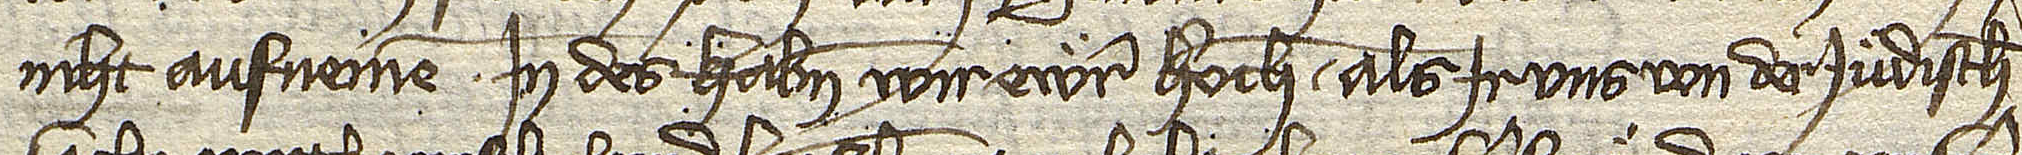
niht aufneme* . In des habn* wir eẅr* hoch* / als Ir vns von der Iüdiſch*
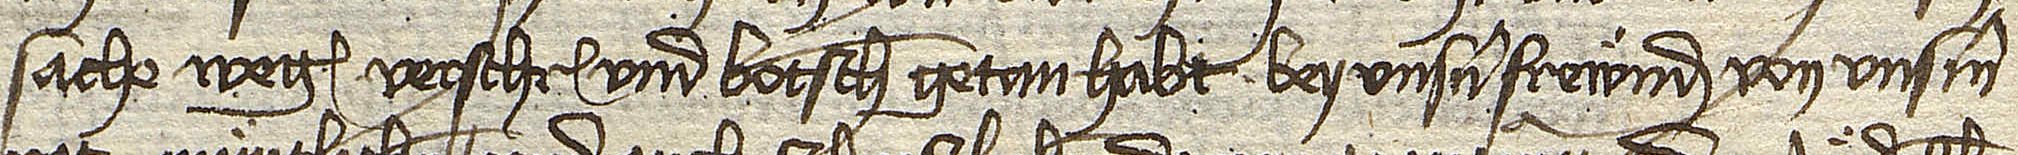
ſache weg* verſchr* vnd botſch* getan habt . bey vnſn* freẅnd* von vnſm*
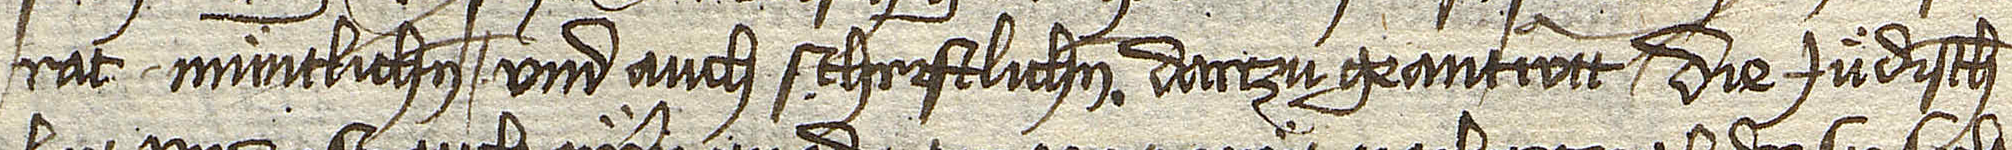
rat / müntlichn* / vnd auch ſchriftlichn* . darcʒu geantw*tt / Die Iüdiſch*
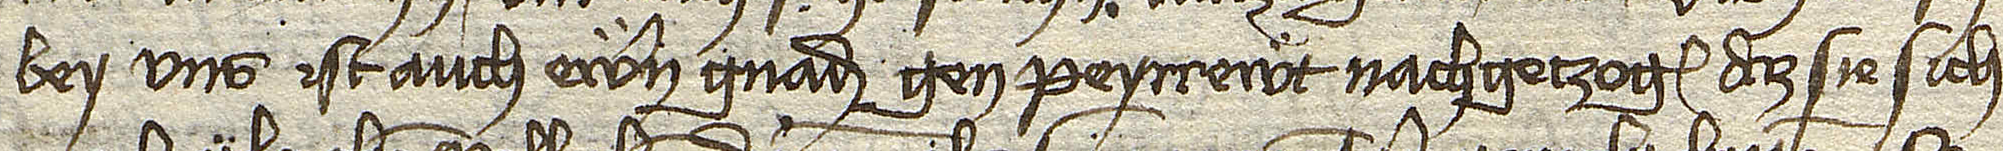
bey vns iſt auch eẅ*n gnad* gen Peyrreẅt nachgecʒog* daʒ ſie ſich
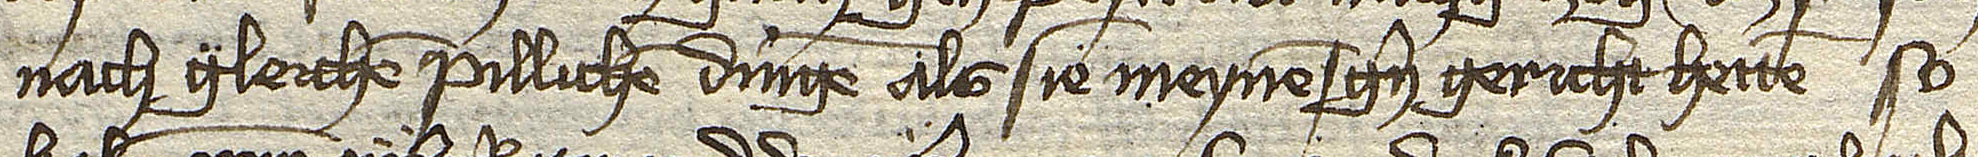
nach gleiche* Pilliche* dinge* als ſie meyne* / g*n gericht hette* ſo
